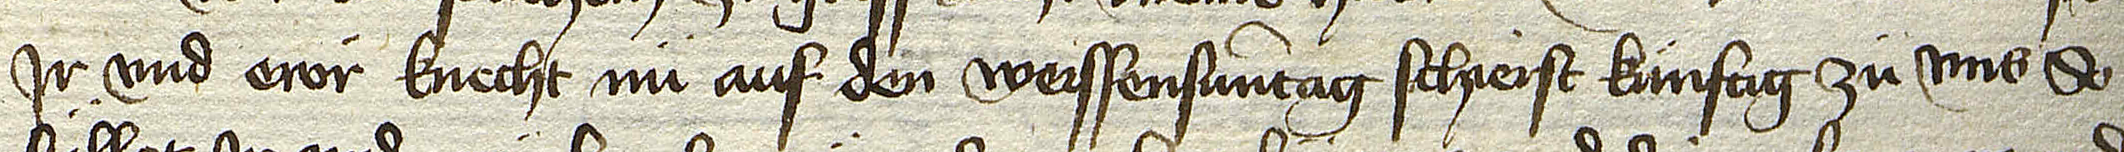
Ir vnd eẅr knecht nü auf den weiſſenſuntag* ſchierſt künftig cʒü vns So
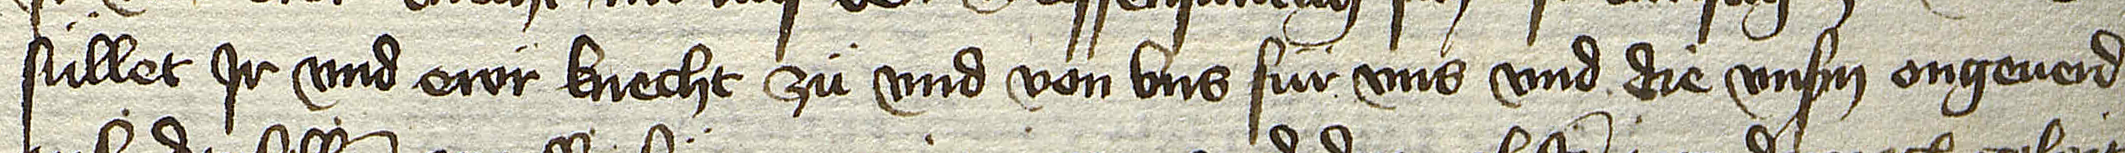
ſüllet Ir vnd eẅr knecht cʒü vnd von vns für vns vnd die vnſ*n on geuerd
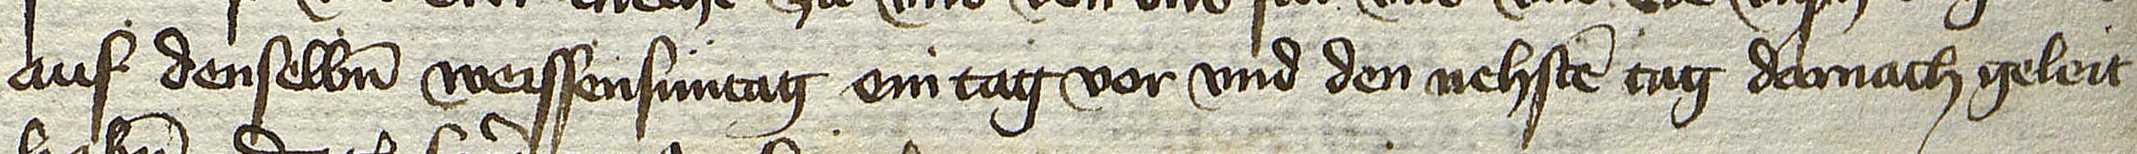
auf denſelb*n weiſſenſüntag ein tag vor vnd den nehſte* tag darnach geleit
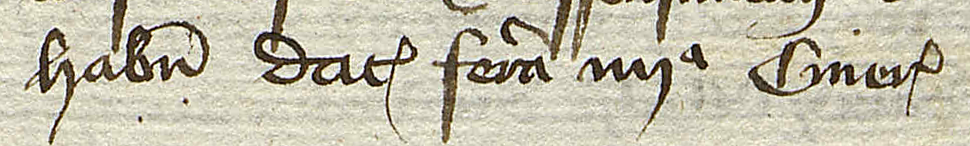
hab*n Dat* fer*a iiii* Ciner*
